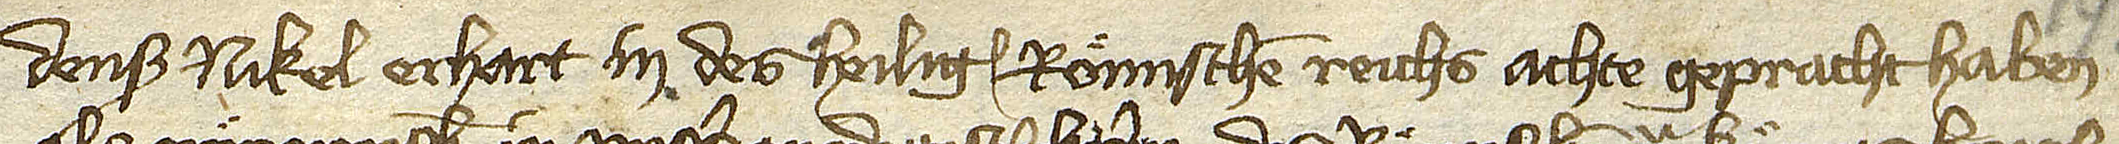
denſ* Nikel erhart in des heilig* Römiſche reichs achte gepracht haben
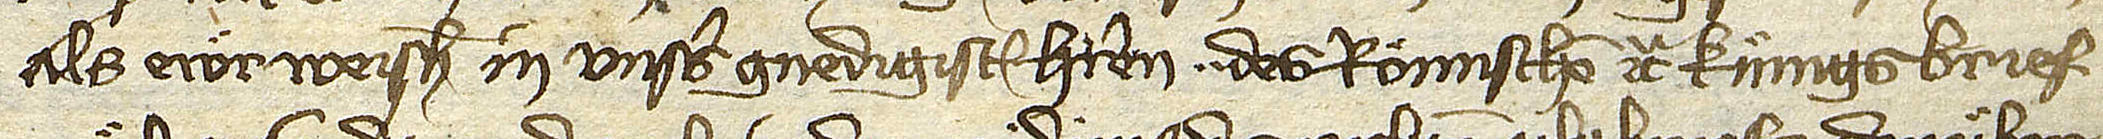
als ewr weiſh* in vnſ*s gnedigiſt* h*ren ~ des Römiſche* ec* künigs brief
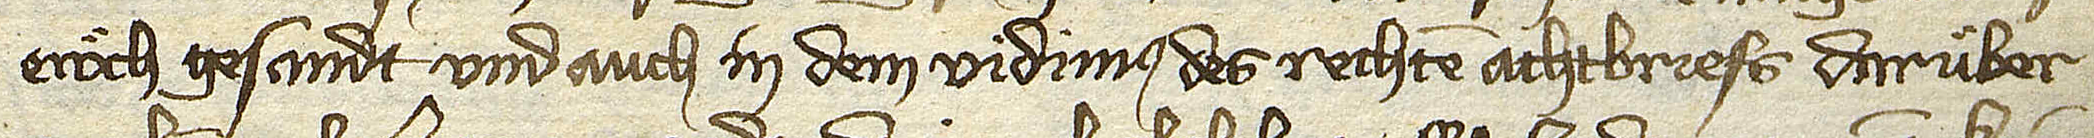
ewch geſandt vnd auch in dem vidim* des rechte* achtbriefs darüber
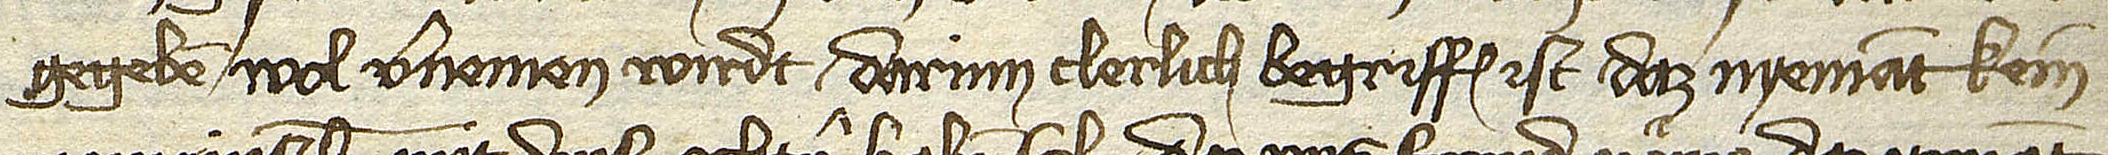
gegebe* wol v*nemen wirdt / darinn clerlich begriff* iſt / daʒ nyema*t kein
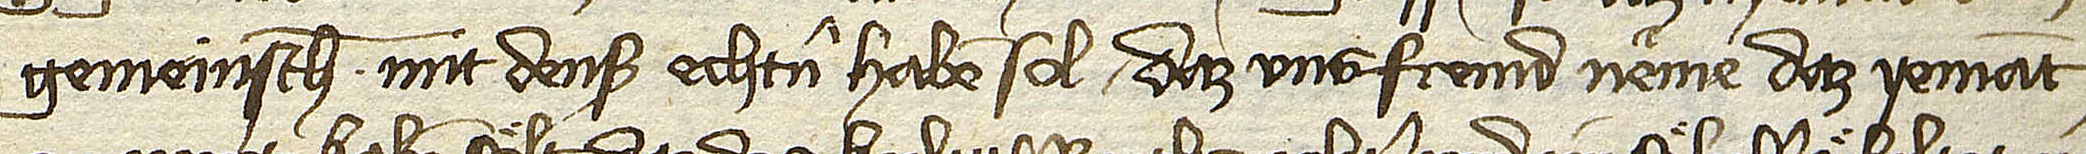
gemeinſch* . mit denſ* echt*n habe* ſol / daʒ vns fremd nëme daʒ yema*t
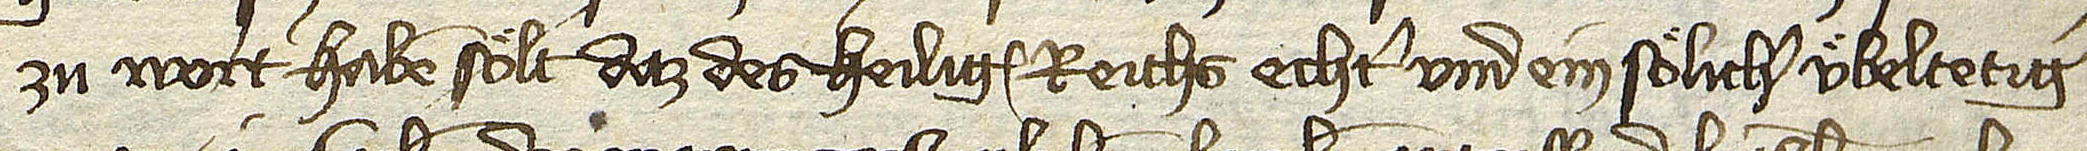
ʒu wort habe* ſölt daʒ des heilig* Reichs echt* vnd ein ſölich* v̈beltetig*
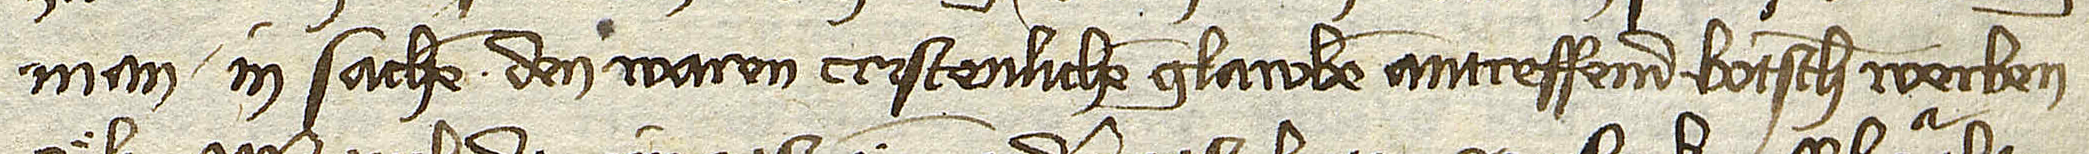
man / in ſache* . den waren criſtenliche* glawbe* antreffend botſch* werben
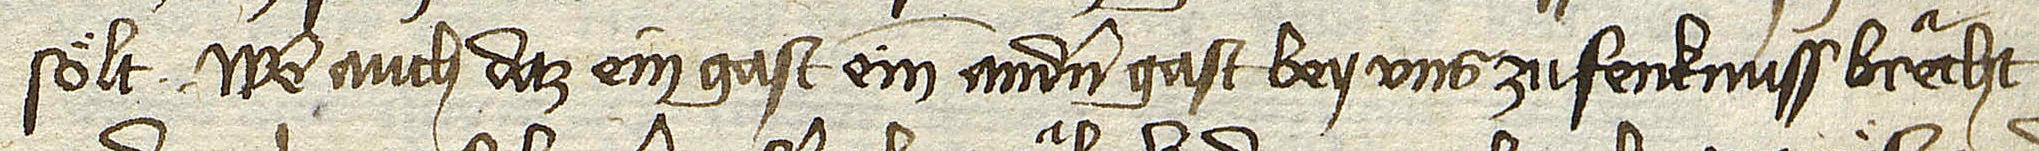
ſölt . We* auch daʒ ein gaſt ein* and*n gaſt bey vns ʒu fenknuſſ brëcht
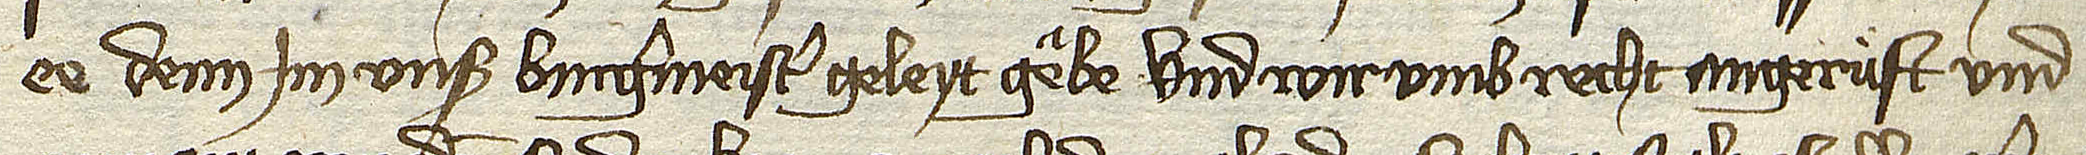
ee denn Im vnſ* burg*meiſt* geleyt gëbe . Vnd wir vmb recht angerüft vnd
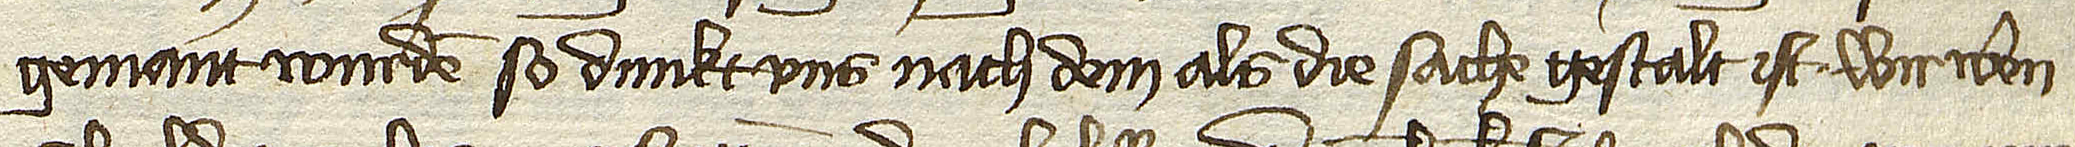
gemant wurde* ſo dunkt vns nach dem als die ſache geſtalt iſt . Wir we*n
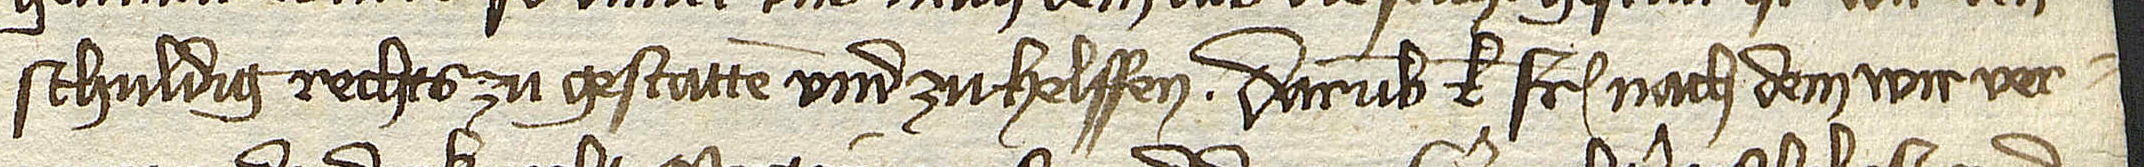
ſchuldig rechts ʒu geſtatte* vnd ʒu helffen . Daru*b L* fr* nach dem wir ver =
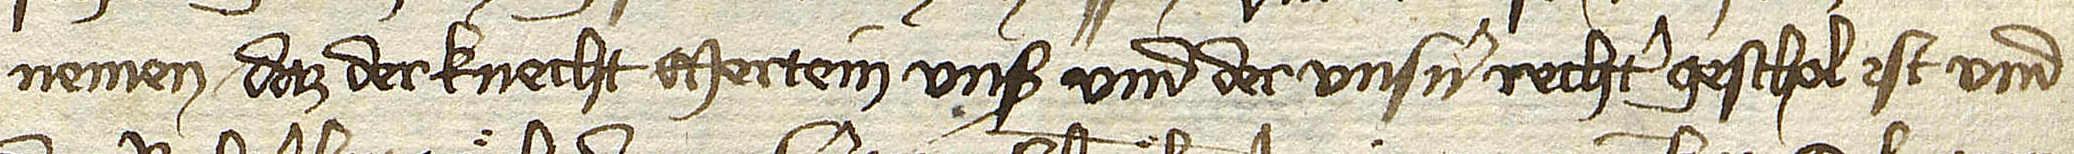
nemen / daʒ der knecht Mertein vnſ* vnd der vnſ*n recht* geſchol iſt vnd
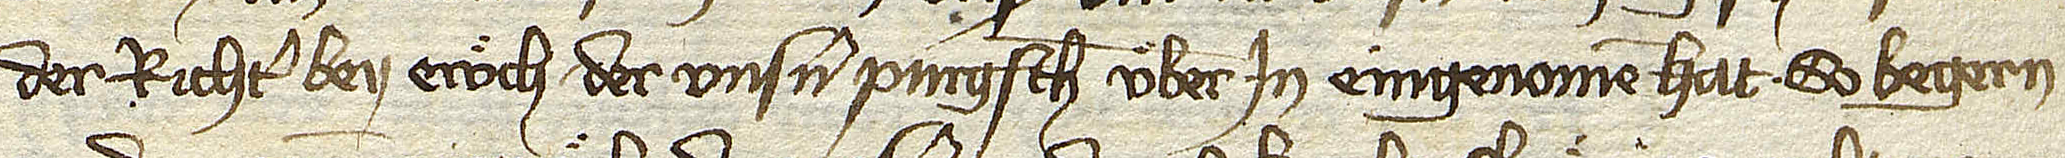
der Richt* bey ewch / der vnſ*n purgſch* v̈ber In eingenome* hat . So begern
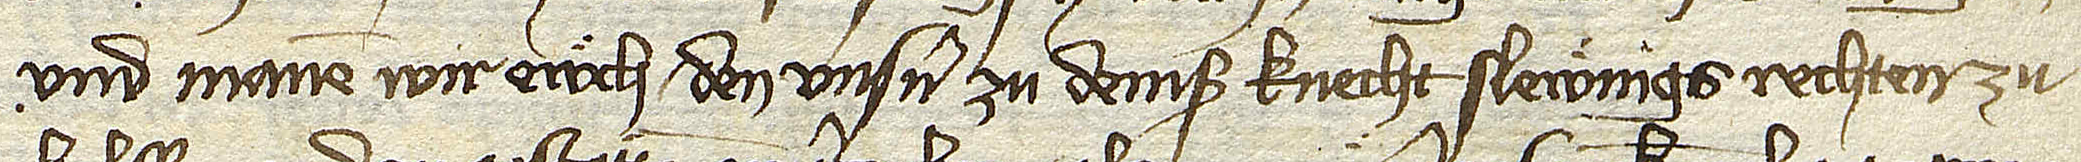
vnd mane* wir ewch / den vnſ*n ʒu demſ* knecht ſlewnigs rechten ʒu
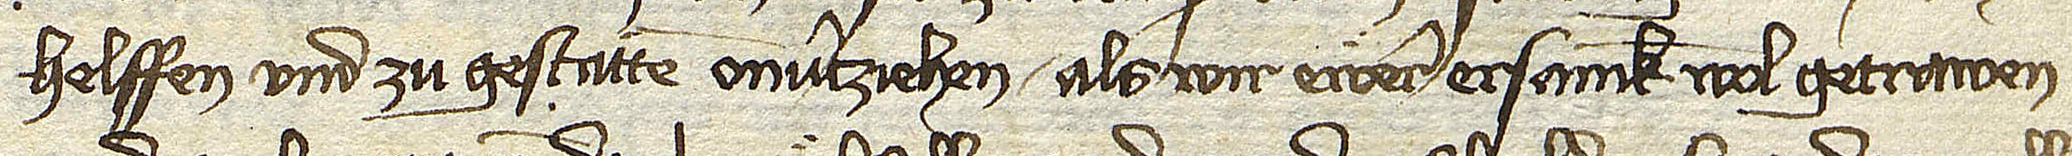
helffen vnd ʒu geſtatte* onu*cʒiehen / als wir ewer* erſamk* wol getrawen
